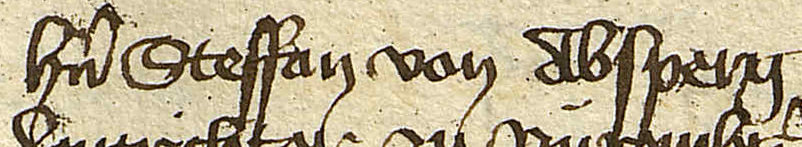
hn* Steffan von Abſperg
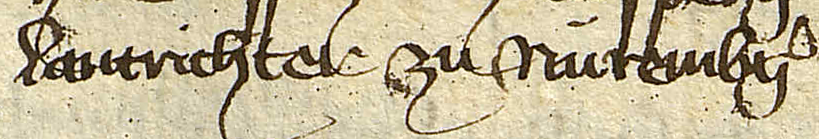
lantrichter cʒu Nürembg*
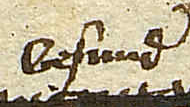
beſund*
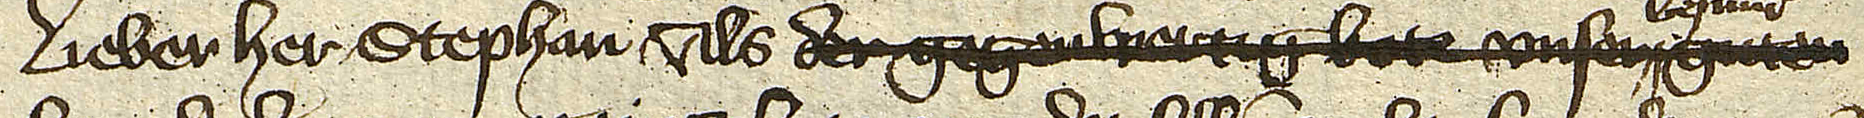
Lieber her / Stephan / Als der gegenwertig bote vnſer guten
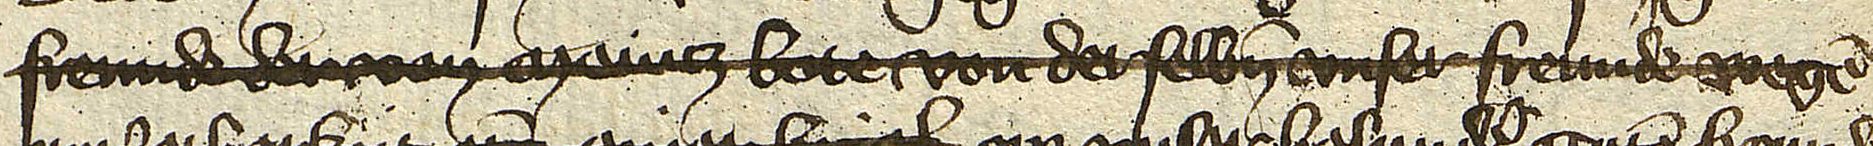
freunde der von Meincʒ bote von derſelbn* vnſer freunde wege*
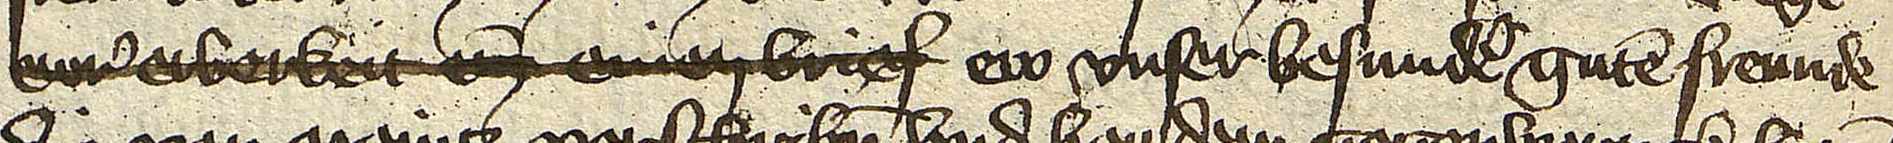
ewr* erberkeit ein* einen brief ew vnſer beſunde* gute* freunde
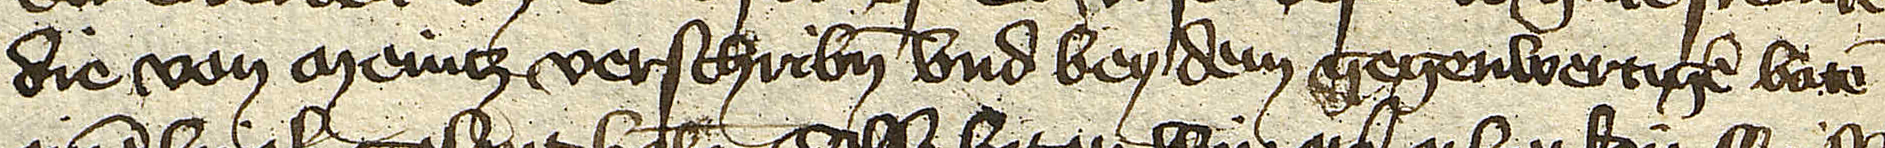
die von Meincʒ verſchribn* vnd bey dem gegenwertige* bote*
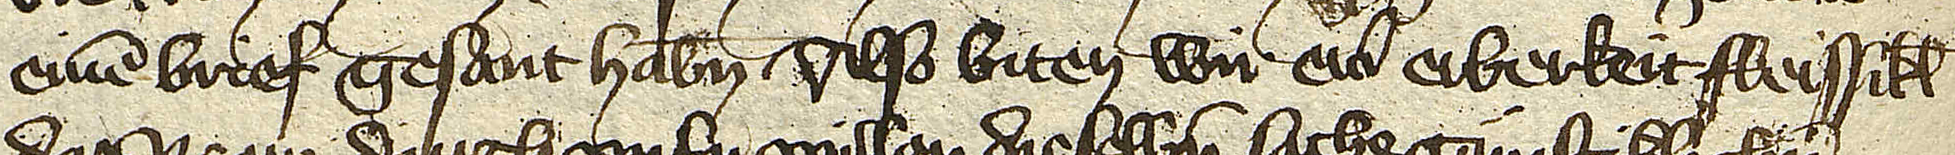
eine* brief geſant habn* / Alſo biten wir ew* erberkeit fleiſſikl*
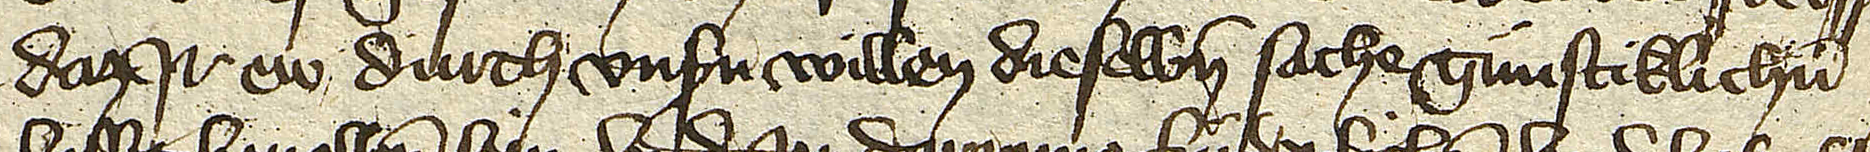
daʒ Ir ew durch vnſ*n willen dieſelbn* ſache günſtiklichn*
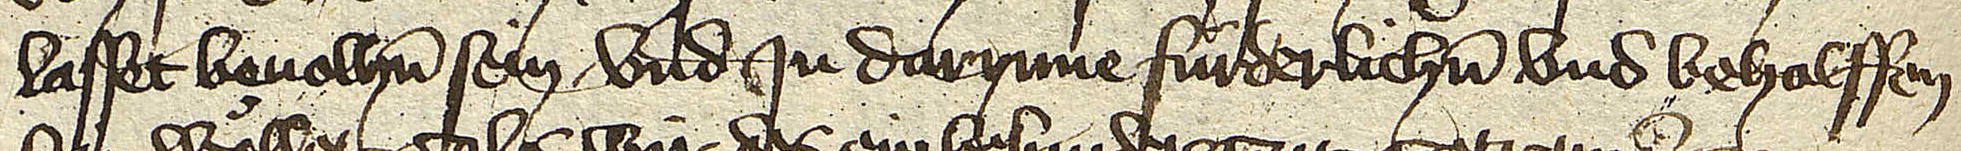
laſſet beuolhn* ſein / vnd In darynne fürderlichn* vnd beholffen
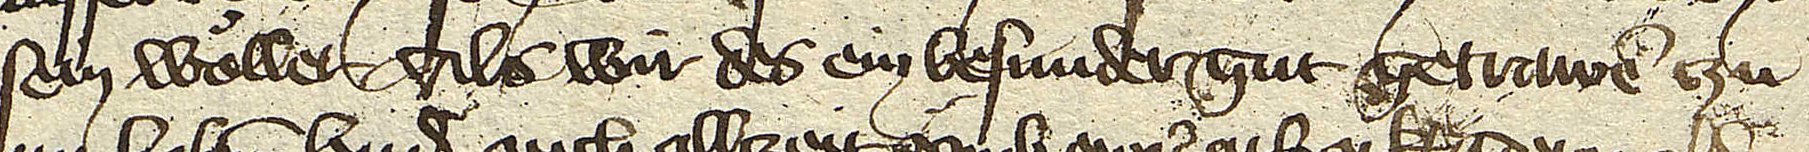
ſein wöllet / Als wir des ein beſunder gut getrawe* cʒu
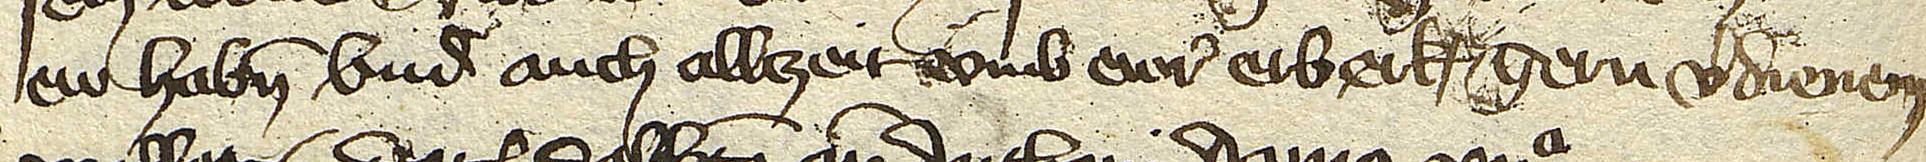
ew habn* vnd auch allcʒeit v̈mb ewr* erberk* gern v*dienen
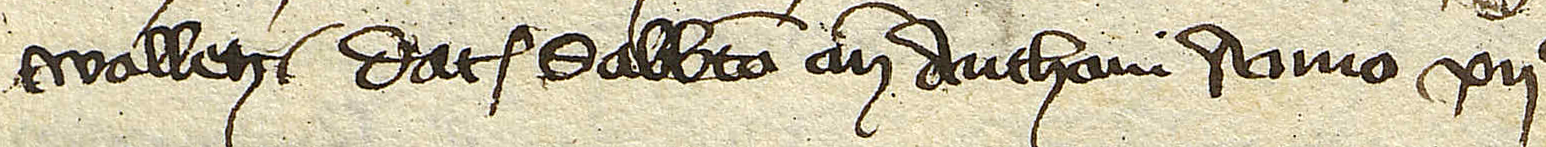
wollen / dat* Sabbto* an* Anthoni Anno xii*
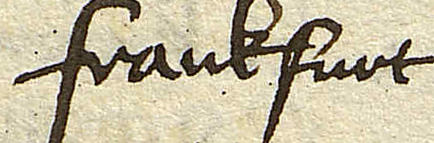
Frankfurt
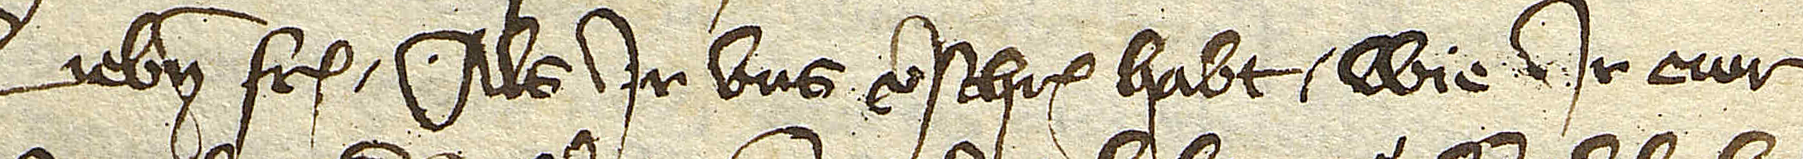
Liebn* fr* / Als Ir vns v*ſchr* habt / wie Ir ewr
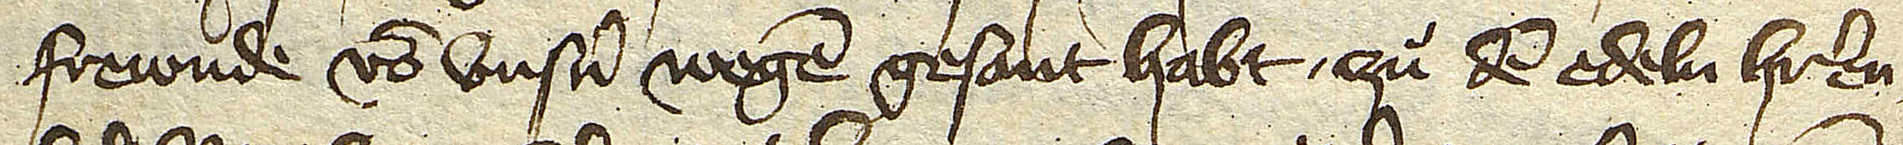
frewnde vo* vnſn* wege* geſant habt / cʒü d* edeln hr*en
